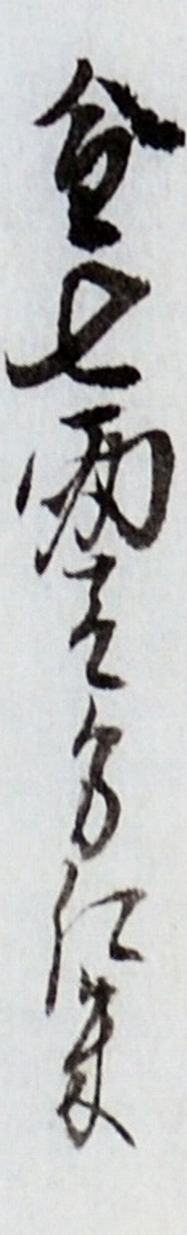〆金七両壱分仁朱
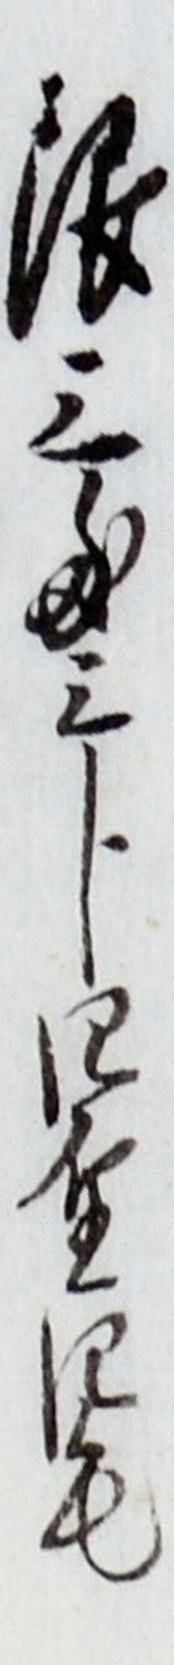銀三匁三分四厘四毛
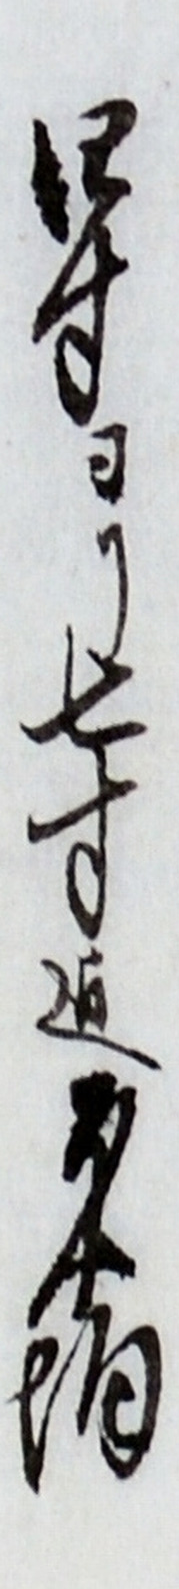四寸ヨリ七寸迄平均
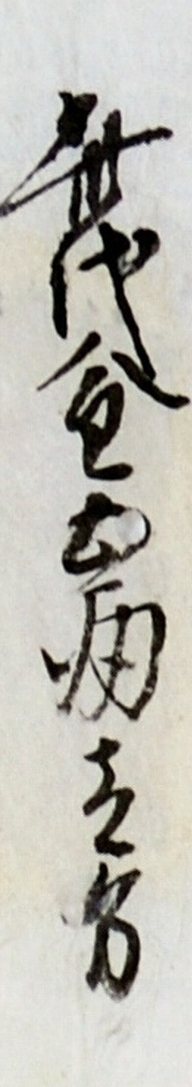此度代金五両壱分
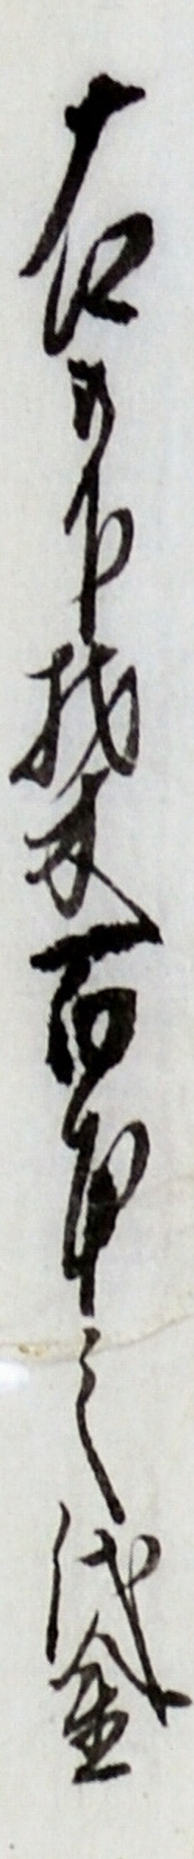右被下材木百本之代金

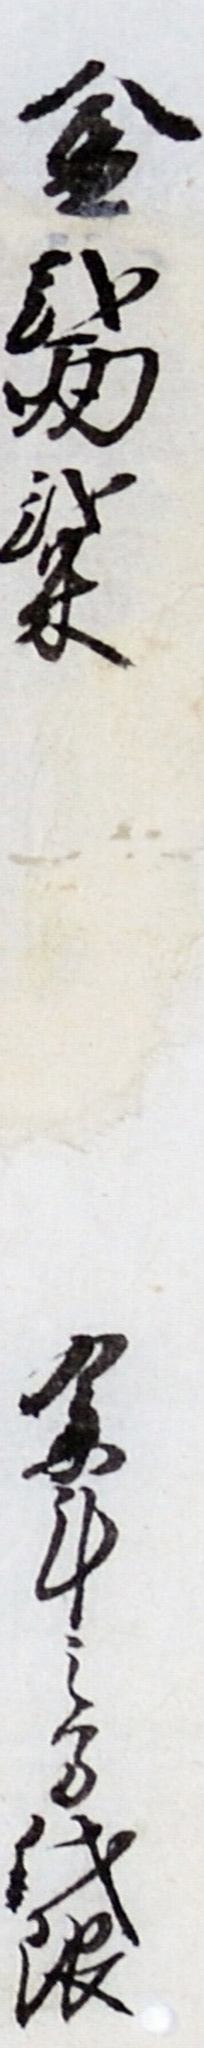金弐両弐朱余計之分伐銀
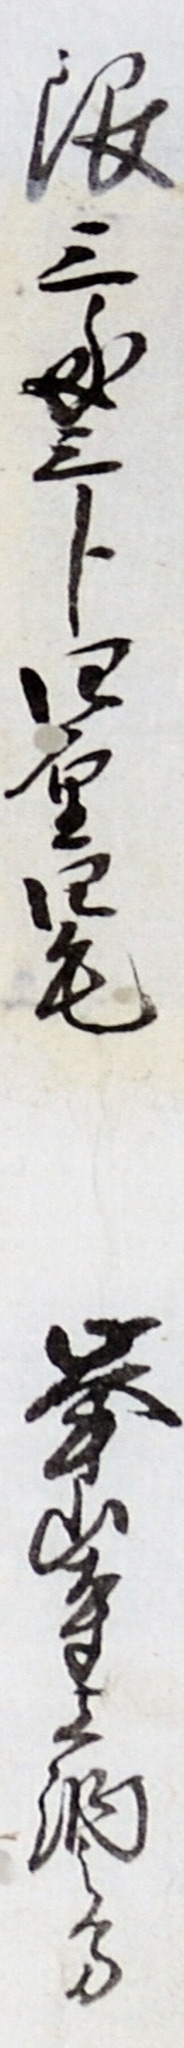銀三匁三分四厘四毛峯山寺上納之分
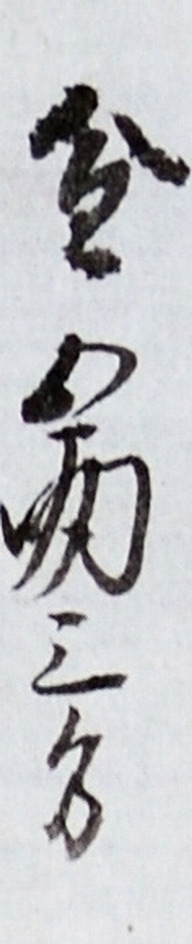金五両三分
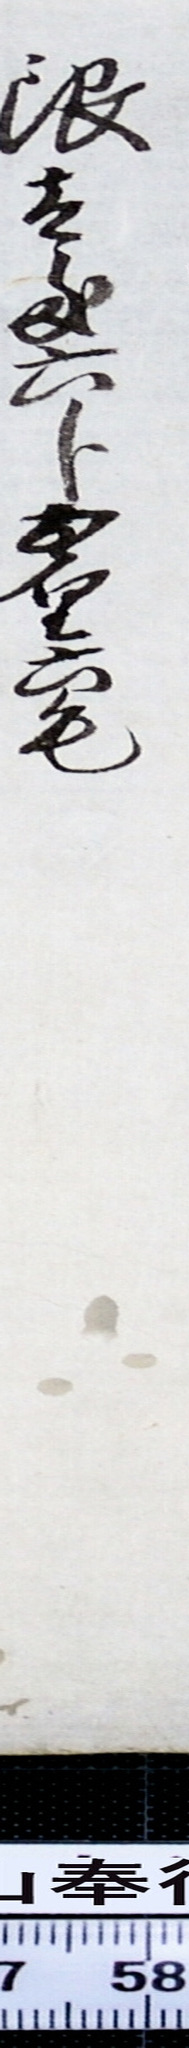銀壱匁六分五厘六毛
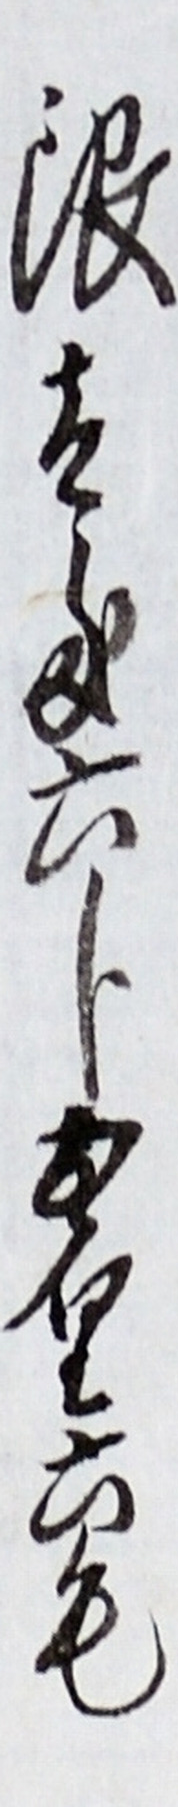銀壱匁六分五厘六毛
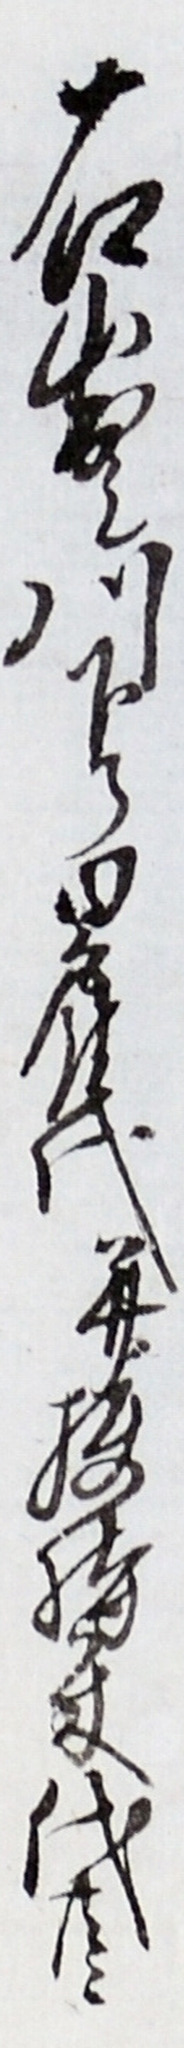右山出シ川下り日雇代并扶持米代共ニ
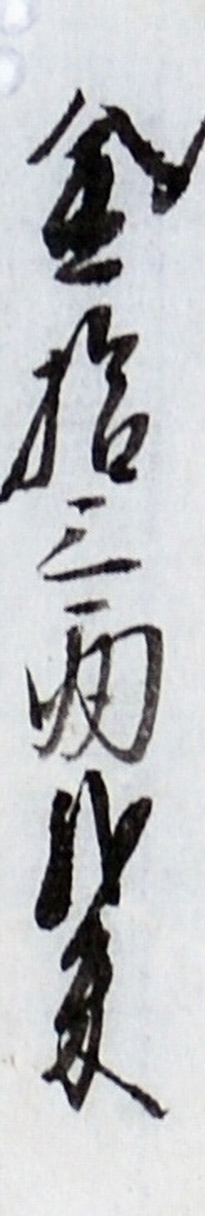金拾三両弐朱
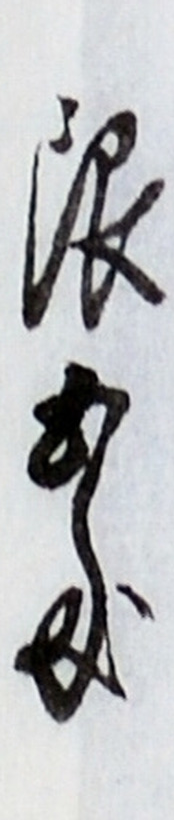銀五匁
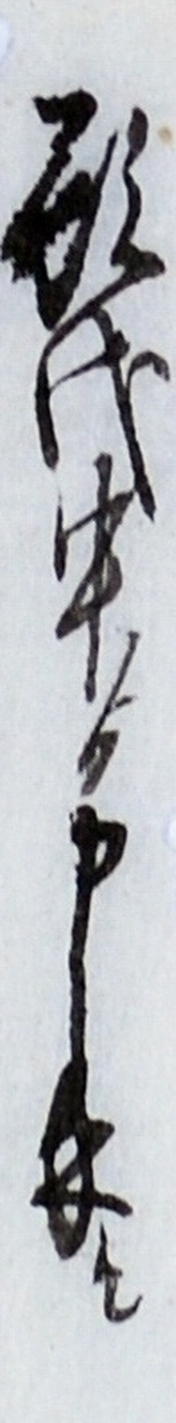郡代中ゟ申来ル

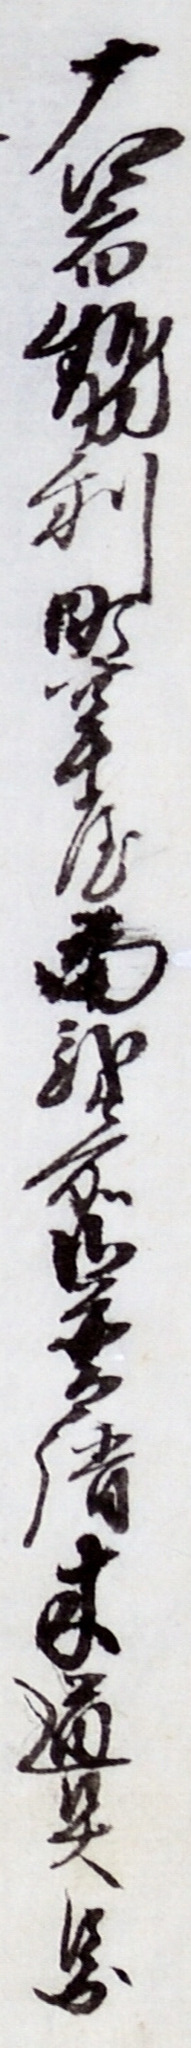右者勢利町牢屋南弐ヶ所御普請木道具図
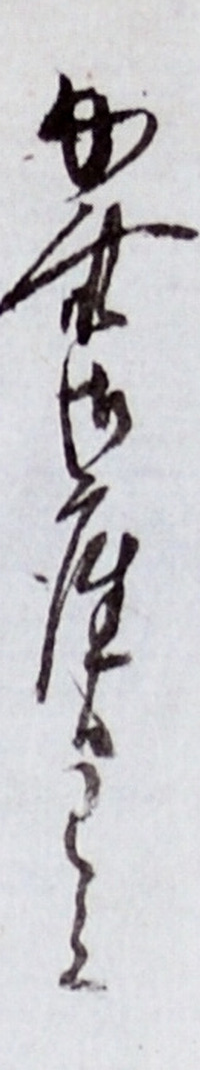無御座候已上
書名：御山奉行御用控
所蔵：伊那市立高遠町図書館・合同会社AMANE
